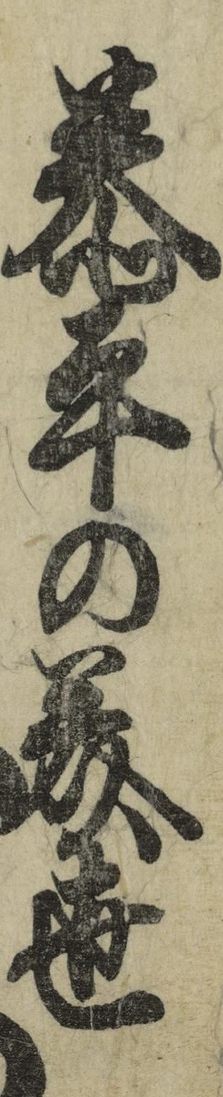泰平の美世
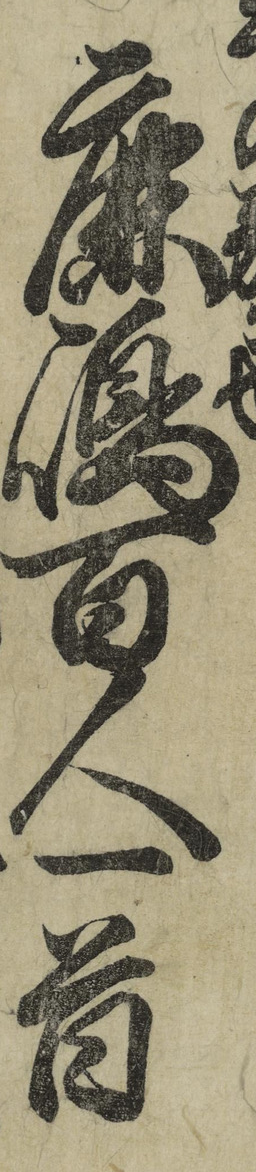鹿嶋百人一首
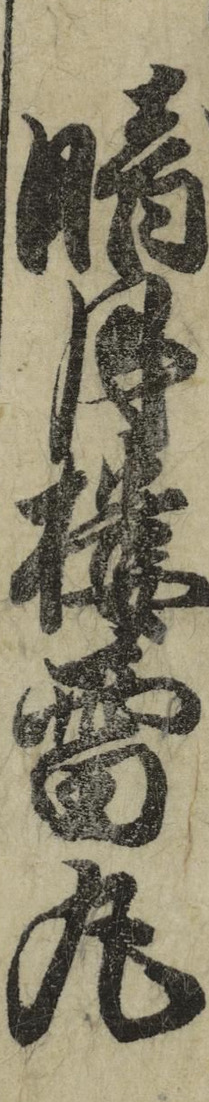晴月楼雷丸
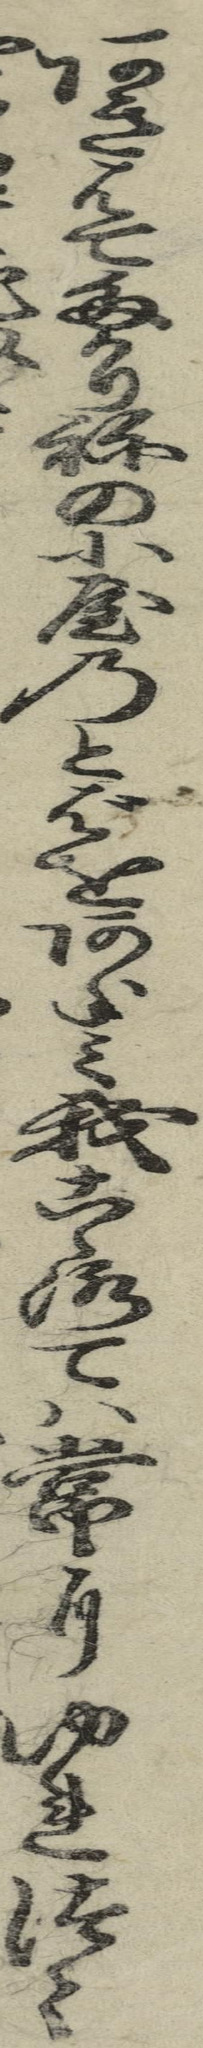あきはてたかりねの小屋のとばをあらみ我こころては常にゆれつつ
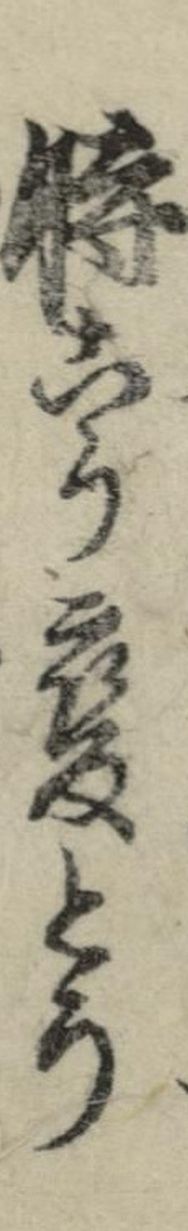持こう変とう
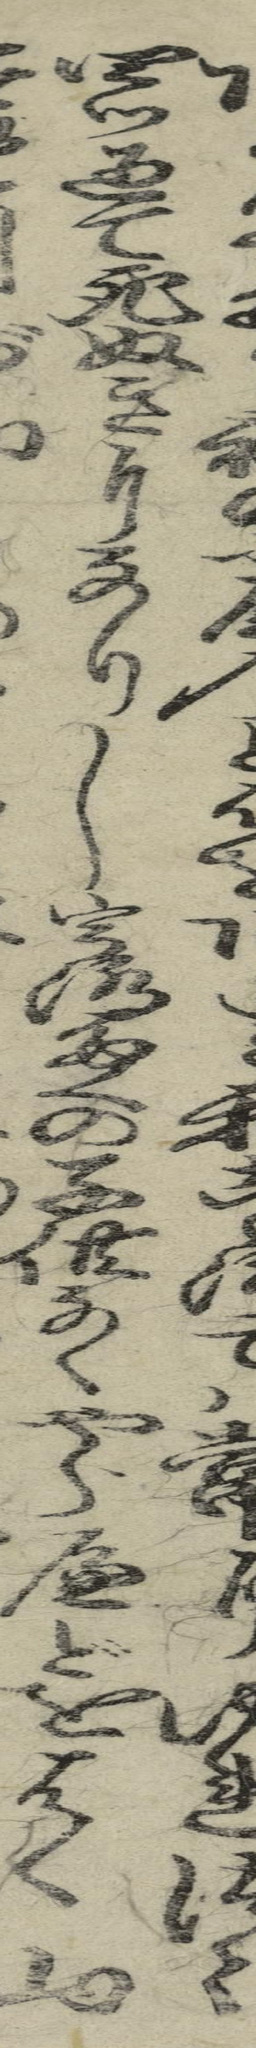四ツ過て死ぬきになりしうろたへの子供なくやらへどをはく山
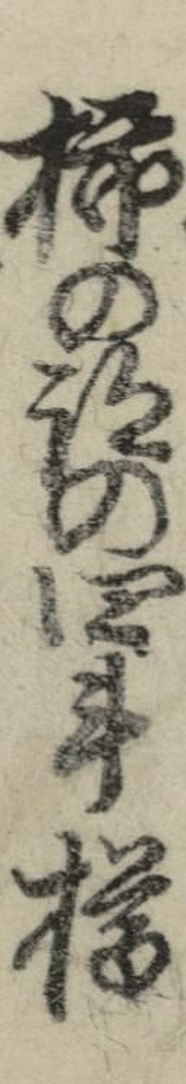柿の跡の四斗樽
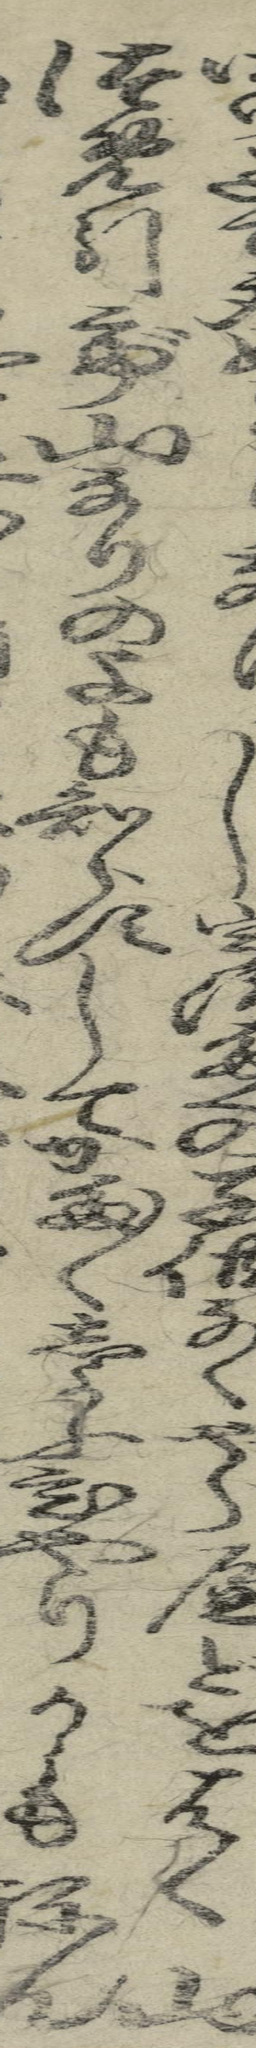つめ引で山なりのよも知らずしてかた〳〵しかふひやりかもねん
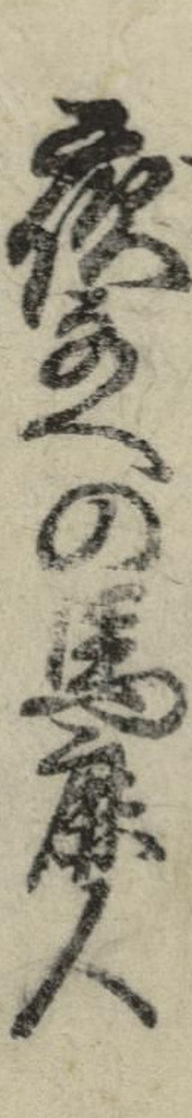夜なへの馬鹿人
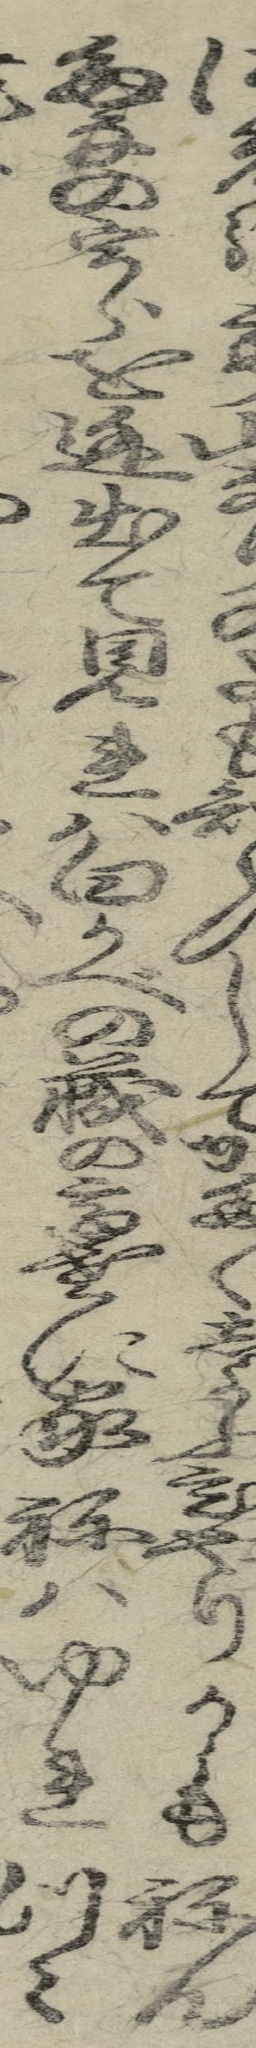たなのうらを逃出て見れは白かべの蔵の高さに家ねはゆれつゝ
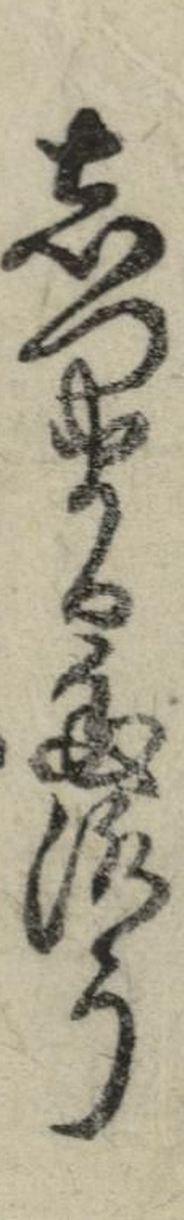しつまるたろう
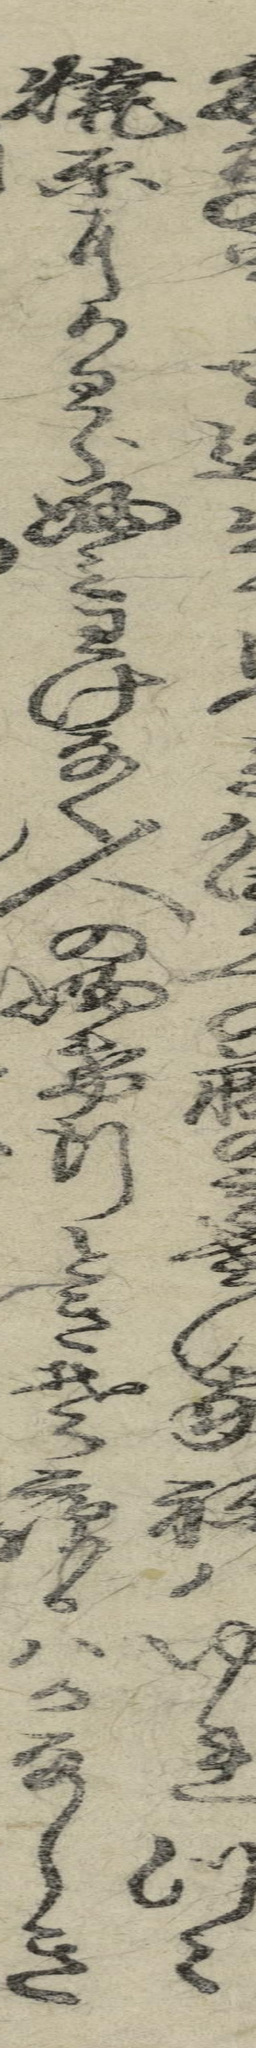焼原にかわらふみわけなく人のふけ行ときそ夜るはかなしき
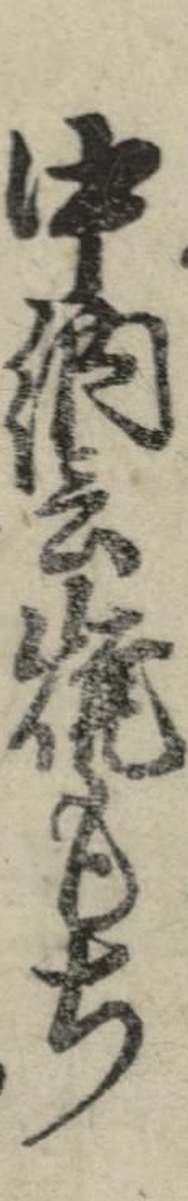中納言焼もち
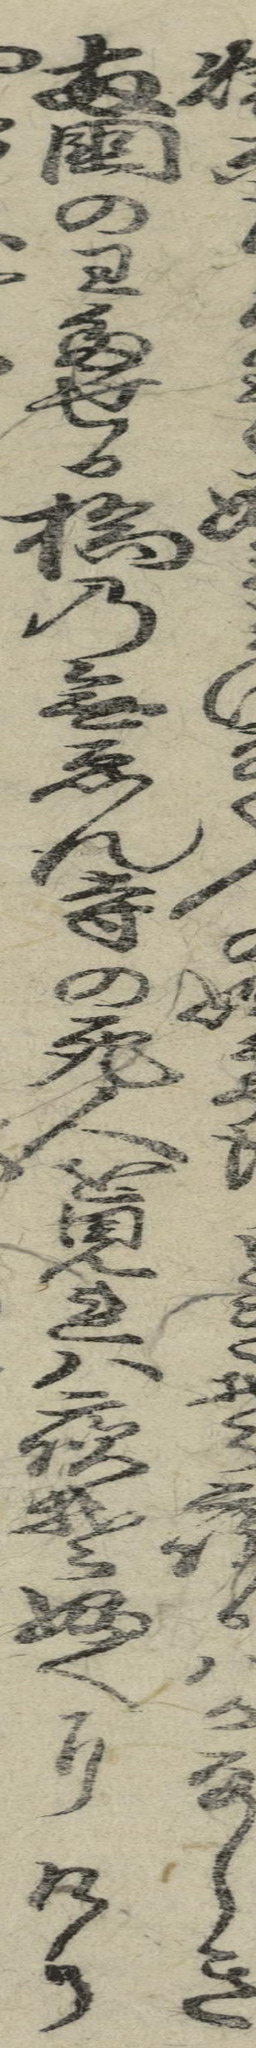両国のわたせる橋の無ゑん寺の死人を見れは夜そふへにけり
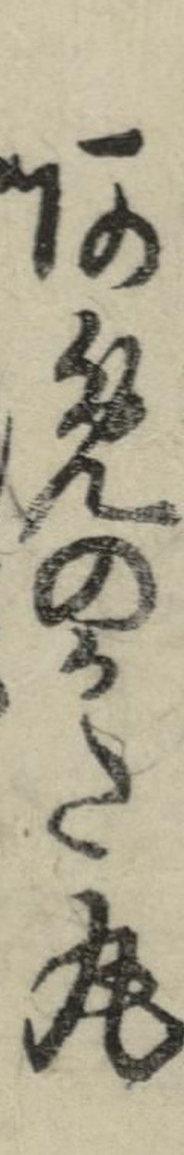あめのかた丸
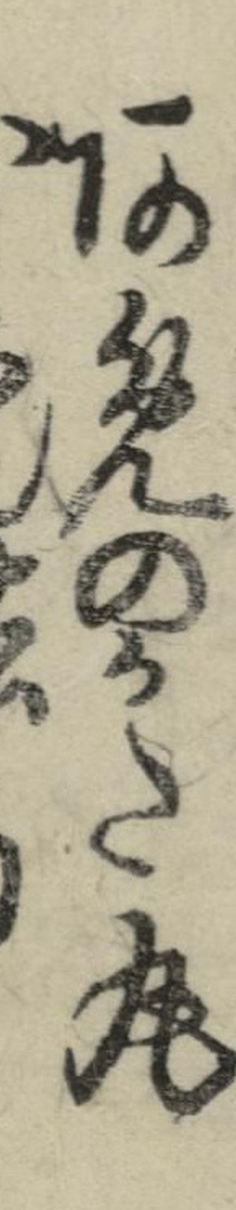あめのかた丸
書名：泰平の美世鹿島百人一首
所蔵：東京大学地震研究所図書室 Earthquake Research Institute Library, The University of Tokyo, JAPAN
